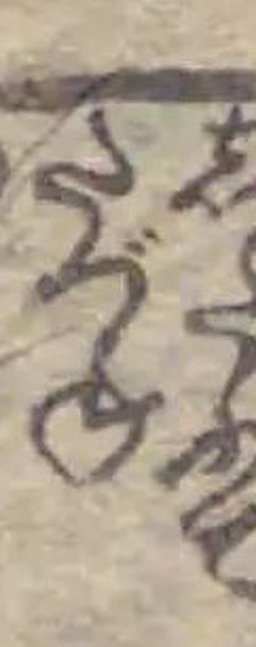たづね
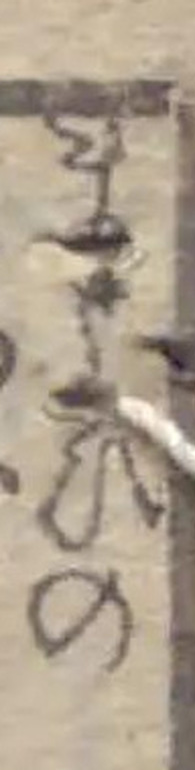まよひの
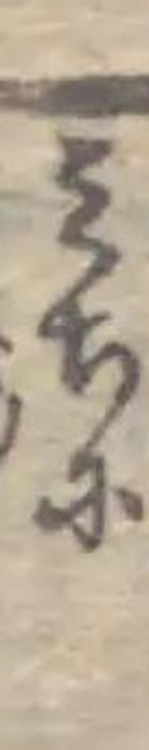みちに
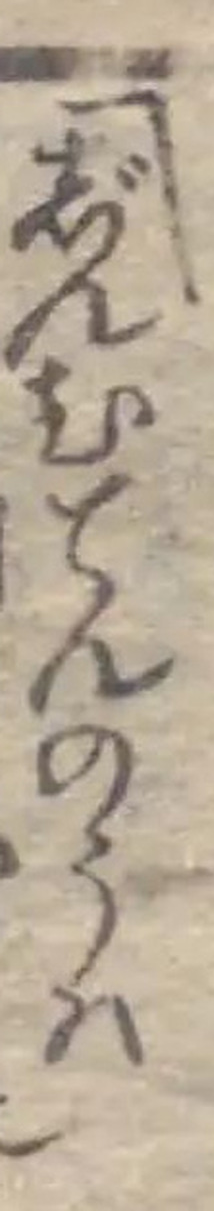〽じんむてんのうは
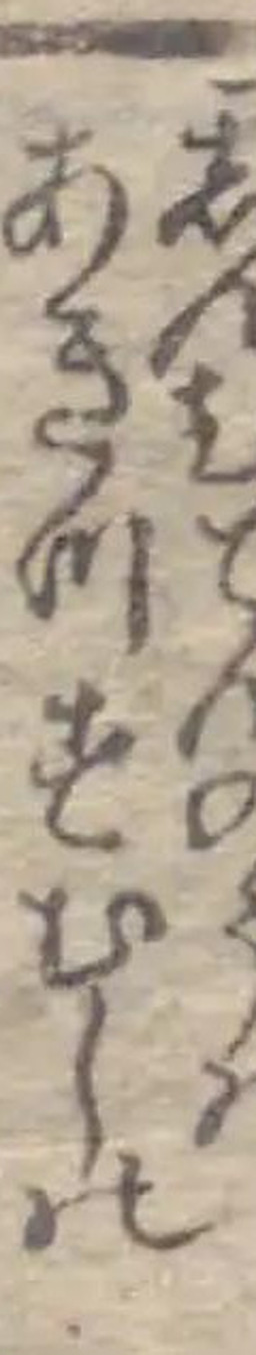あきつすむしの
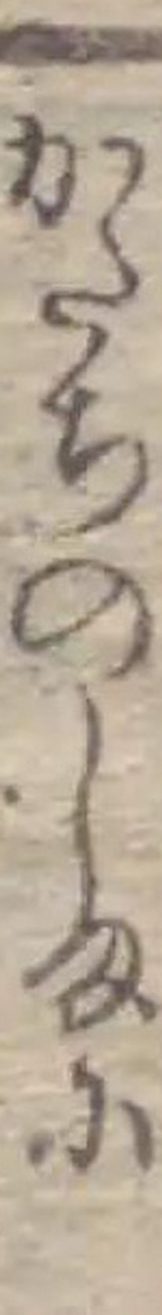かたちのしまに
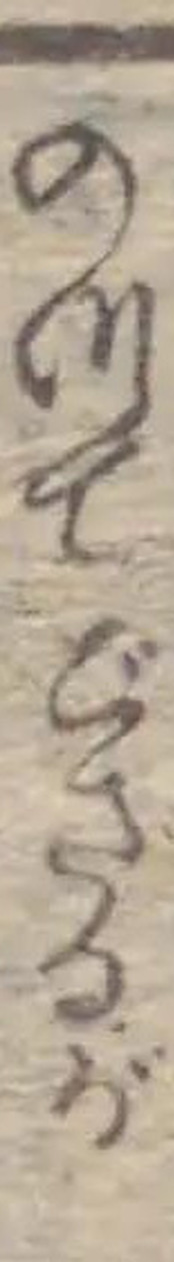のつてござるが
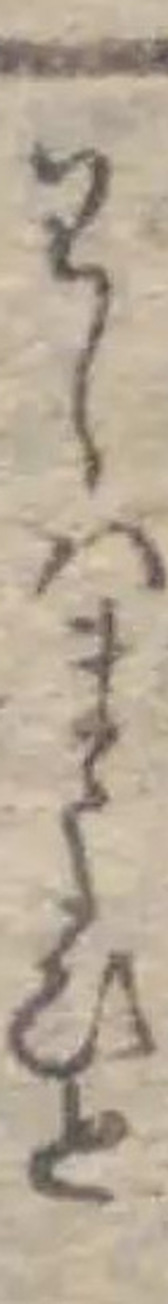わしはまよひと
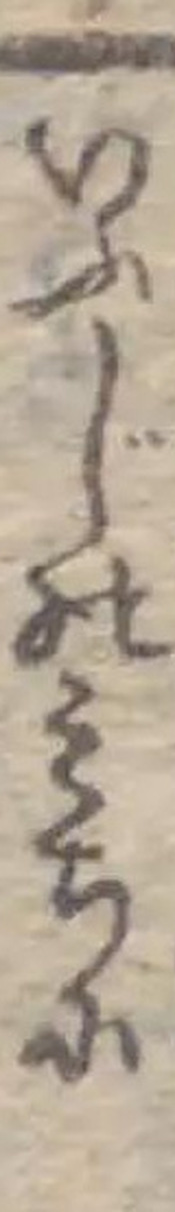いふじのみちに
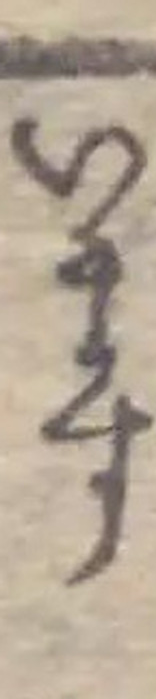います
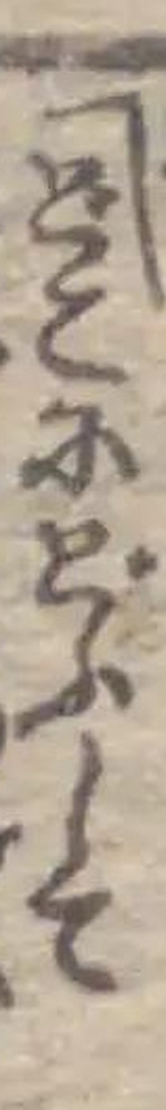〽どこにどふして
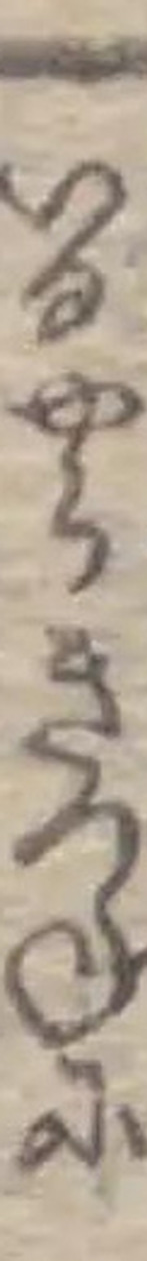いるやらきつねに
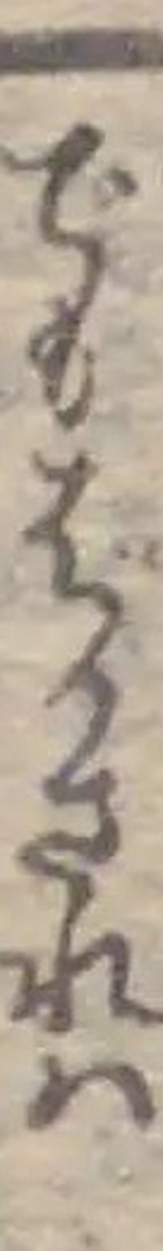でもばかされは
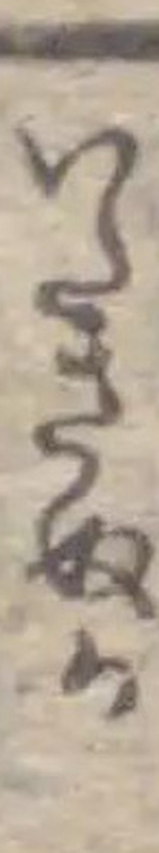いたさぬか

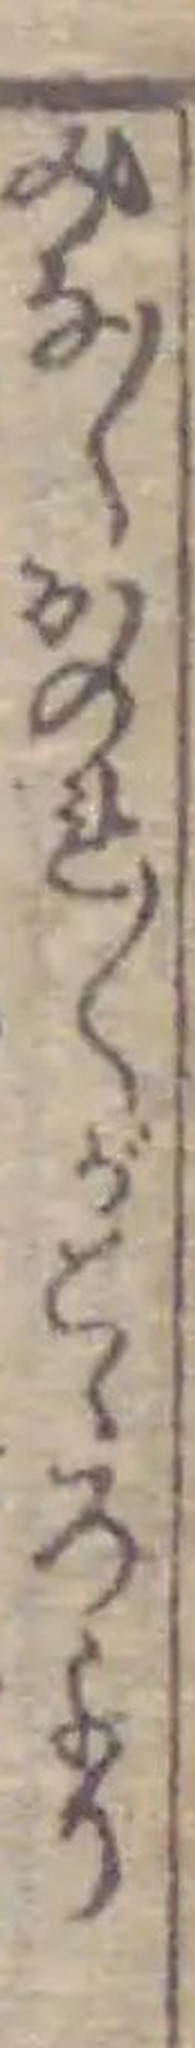みな〳〵おのれ〳〵がこゝろより
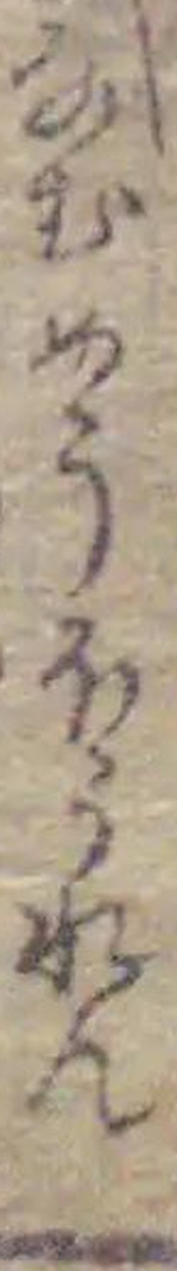〽なむめうほうれん
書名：福壽海旡量品玉 3巻
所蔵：国立国会図書館 National Diet Library, JAPAN
